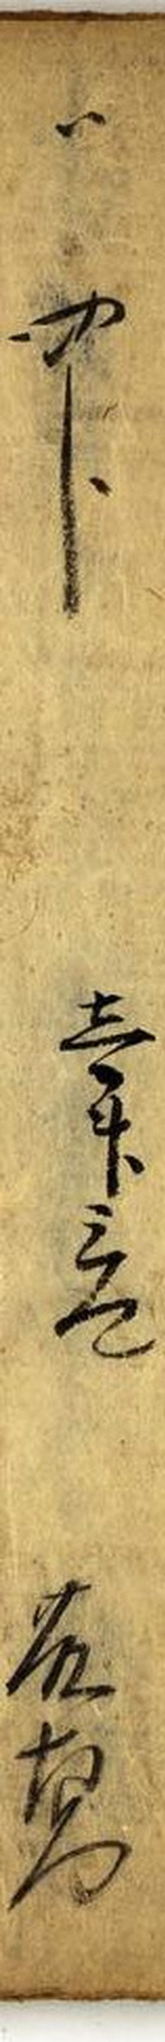同四分壱升三合藤左衛門
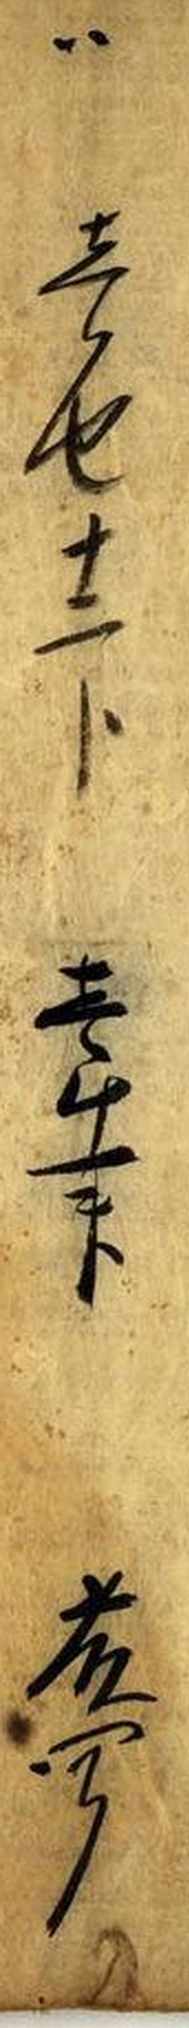同壱セ十二分壱斗一升藤四郎
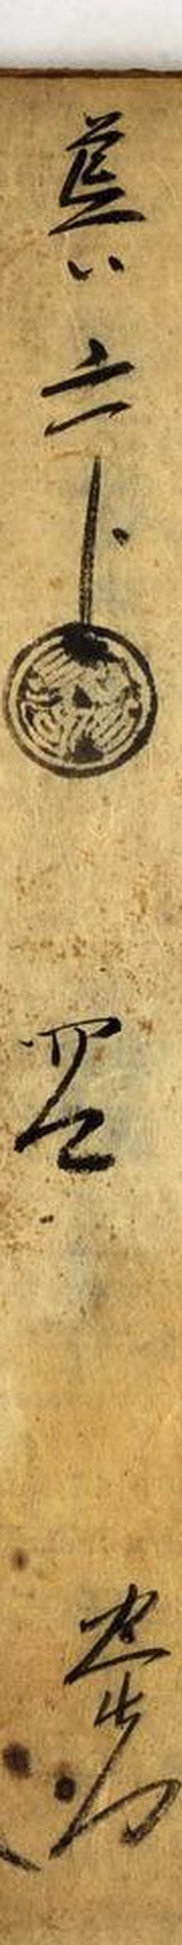荒同六分四合忠右衛門
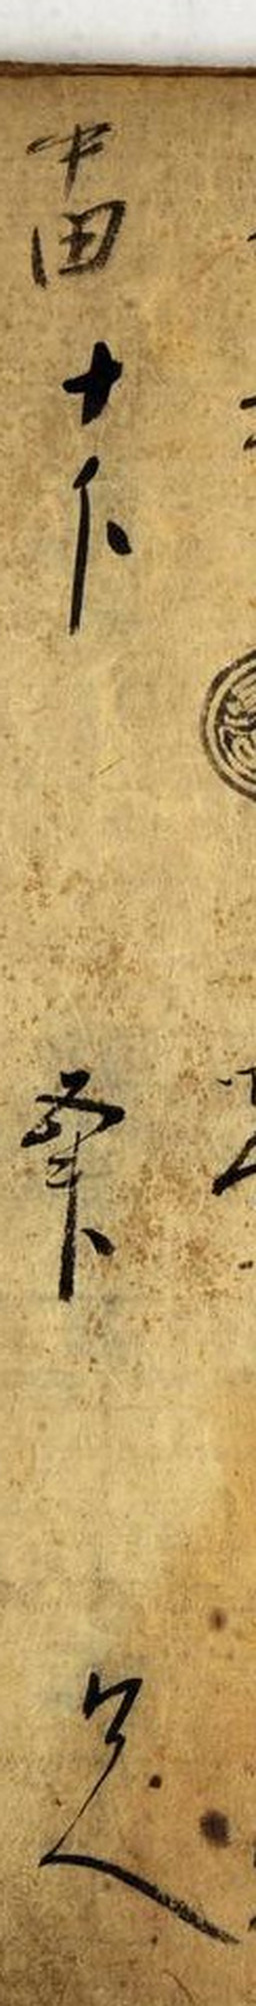中田十分五升同人
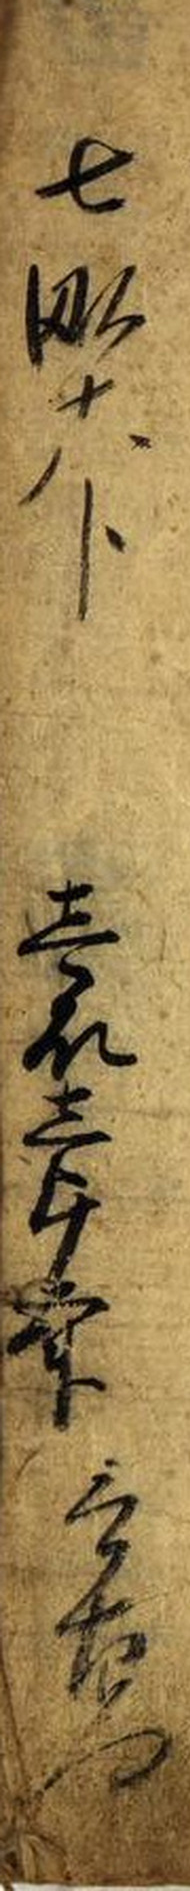同七畝十八分壱石壱斗五升三郎左衛門

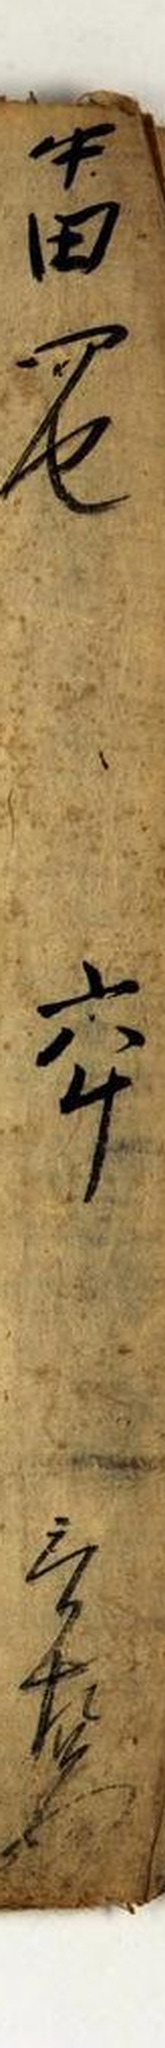中田四セ六升三郎左衛門
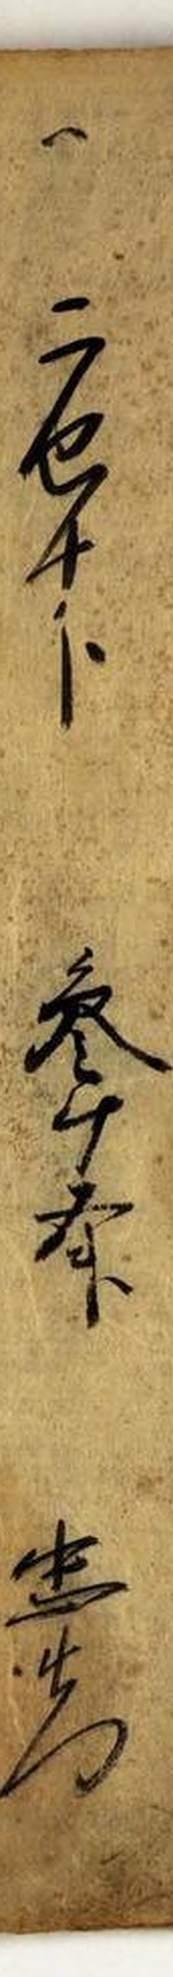同二セ十分参斗五升忠右衛門
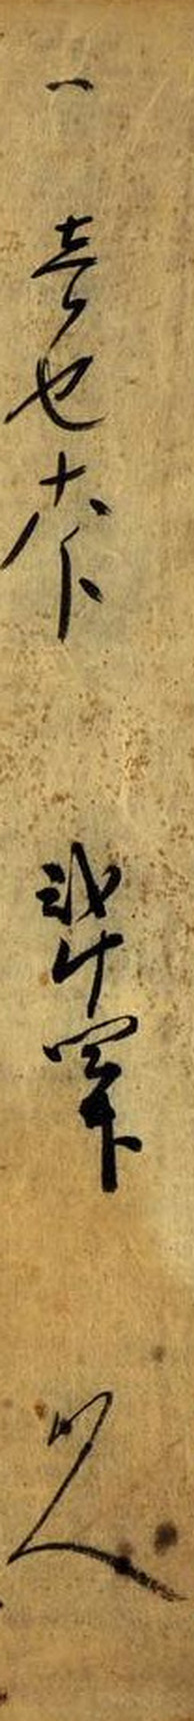同壱セ十八分弐斗四升同人
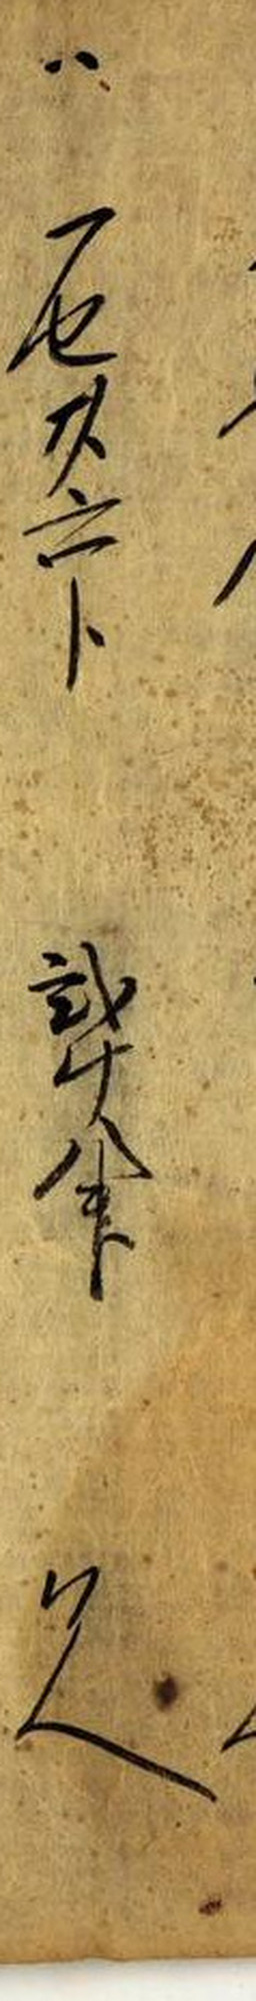同一セ廿六分弐斗八升同人
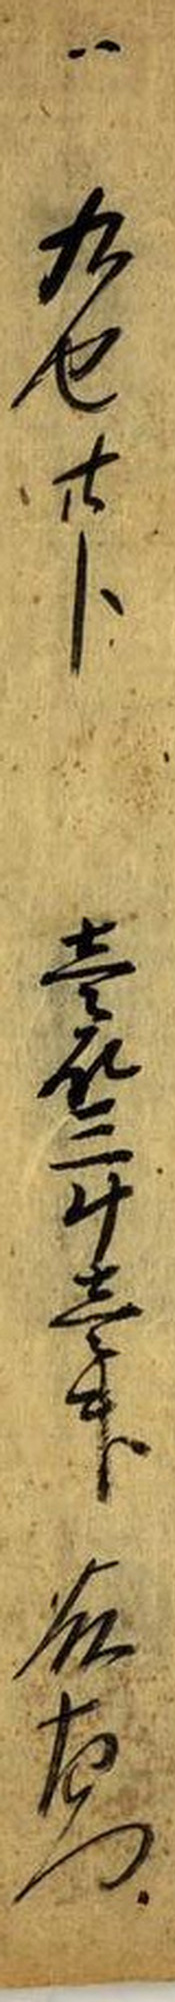同九セ廿分壱石三斗壱升藤左衛門
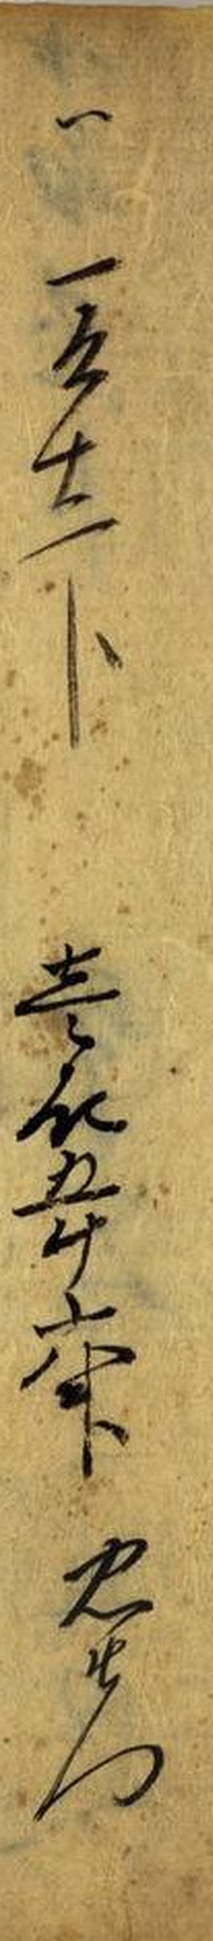同一反十二分壱石五斗六升忠右衛門
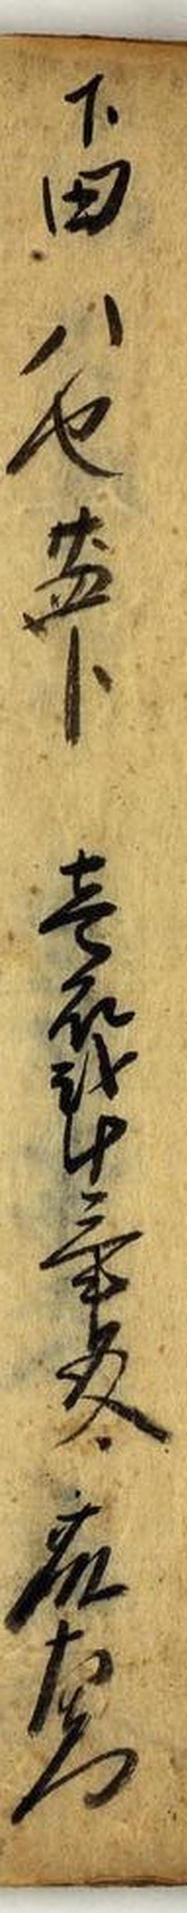下田八せ廿四分壱石弐斗三升五合藤左衛門
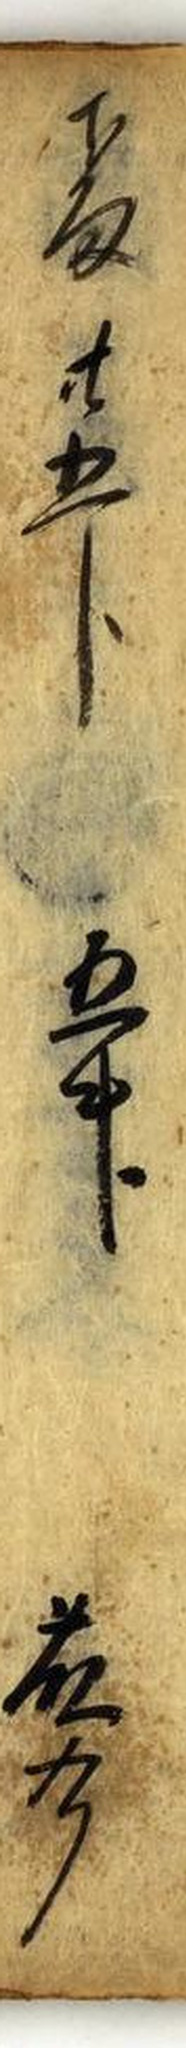下畠廿五分五升藤九郎
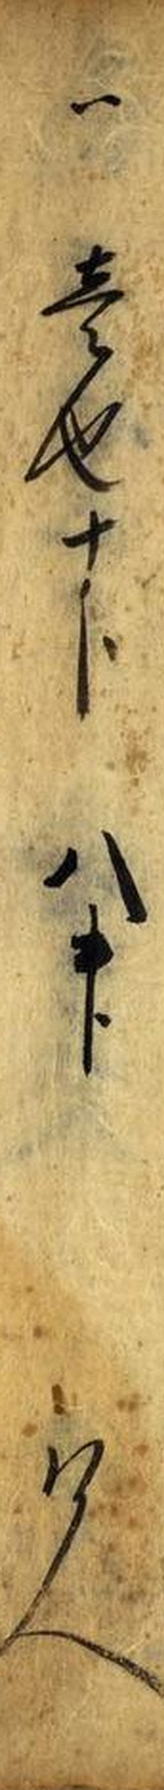同壱せ十分八升同人
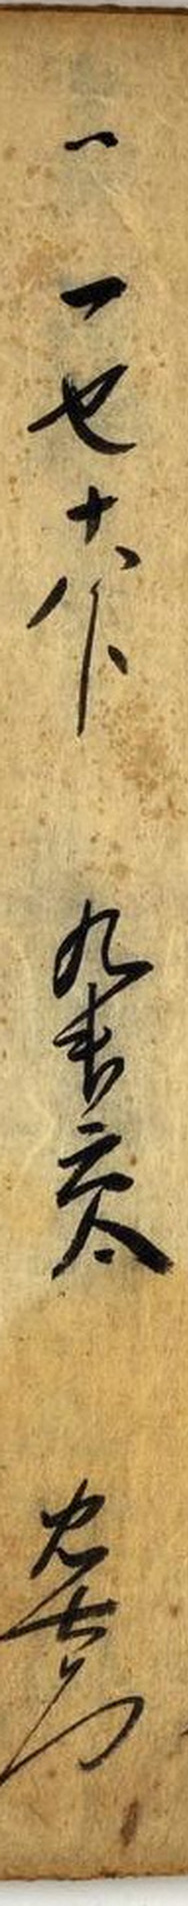同一セ十八分九升六合忠右衛門
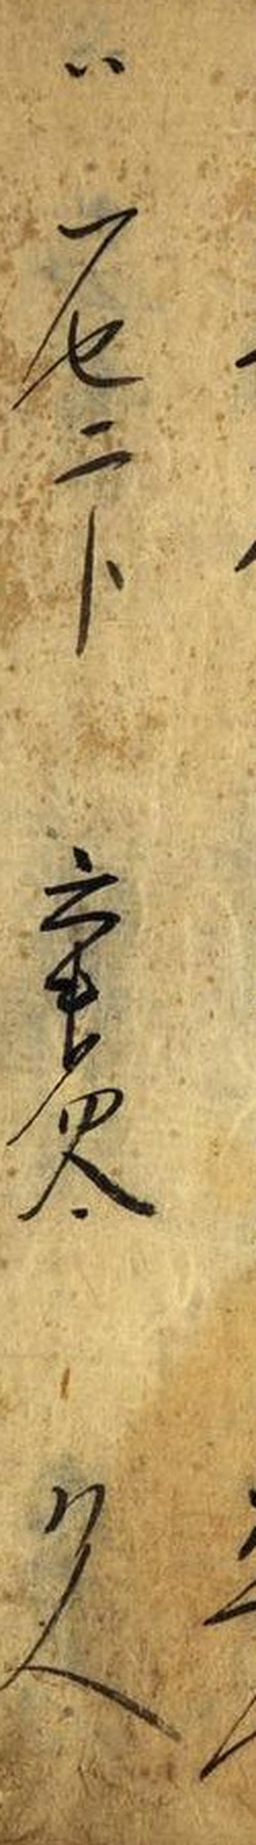同一セ二分六升四合同人
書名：越前国西方内志津庄内本折村御検地帳
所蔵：福井県文書館 Fukui Prefectural Archives
